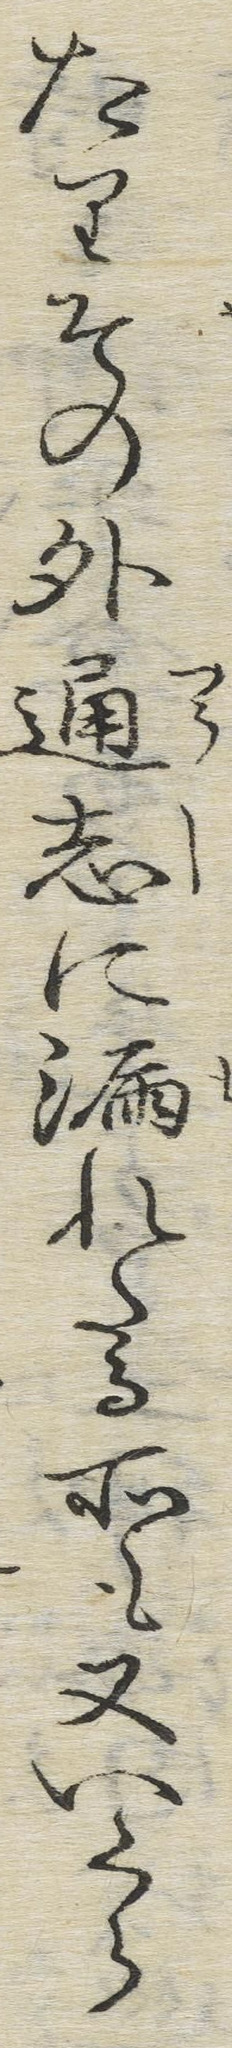たりその外通志に漏れたる所も又いくら
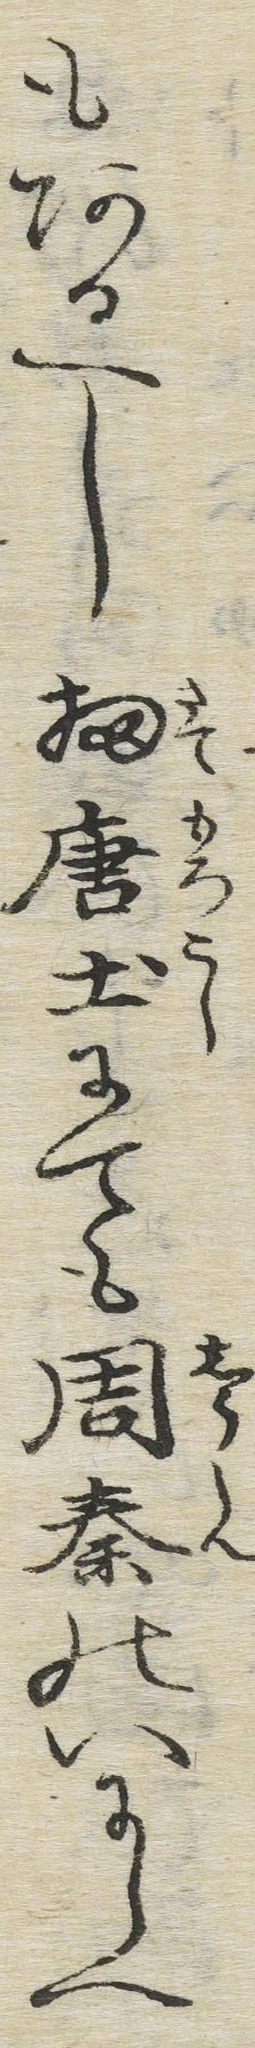もあるへし扨唐土にても周秦のいにしへ
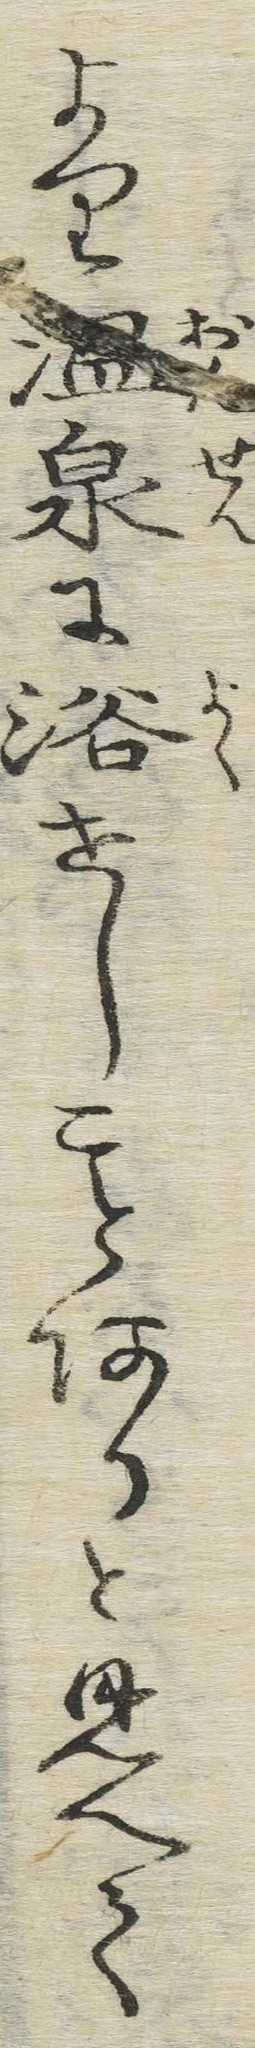より温泉に浴せしことありと見へて
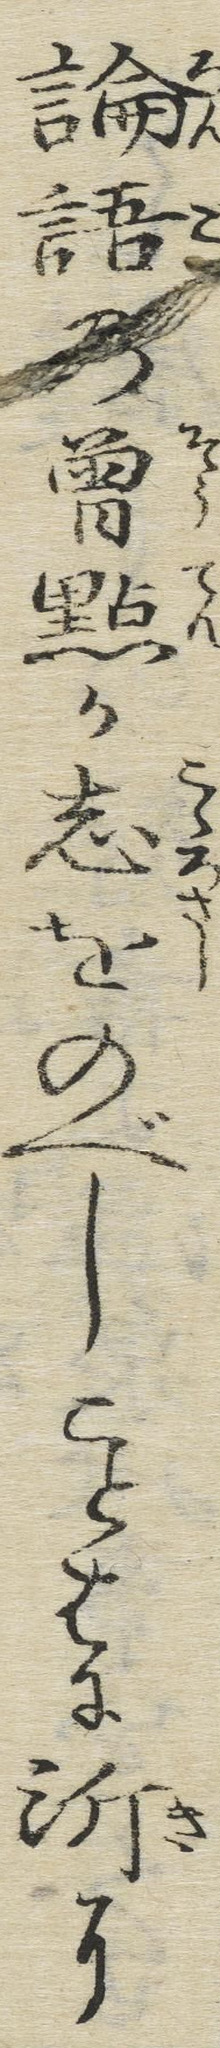論語の曽点か志をのべしことはに沂に
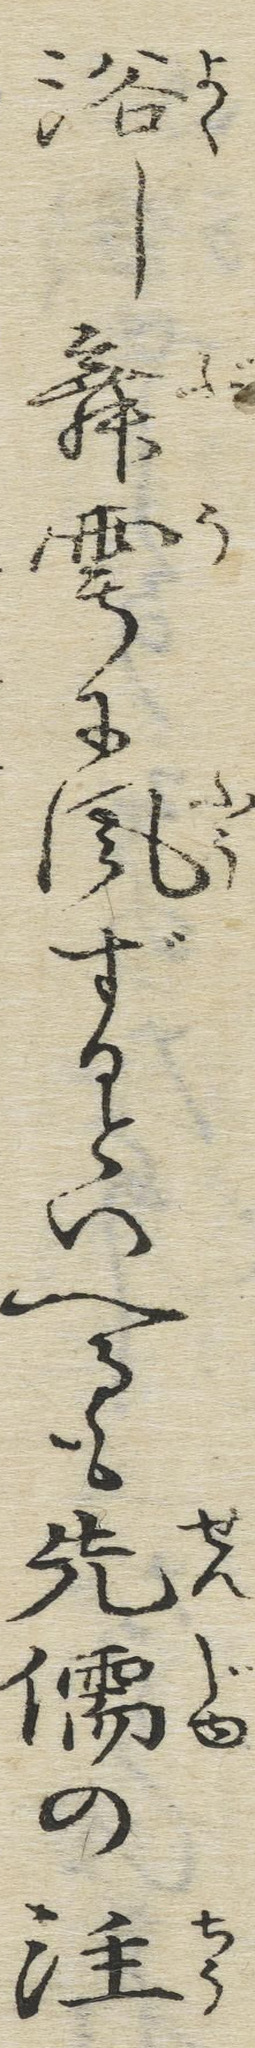浴し舞雩に風ずるといへるも先儒の注
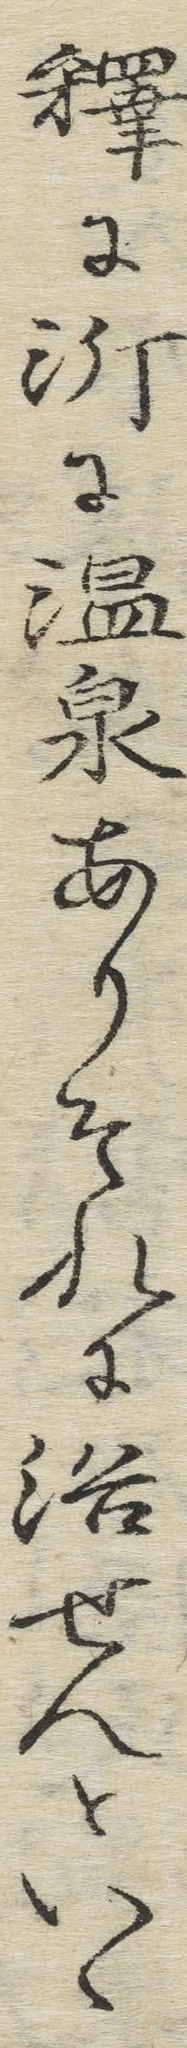釈に沂に温泉ありそれに浴せんといゝ
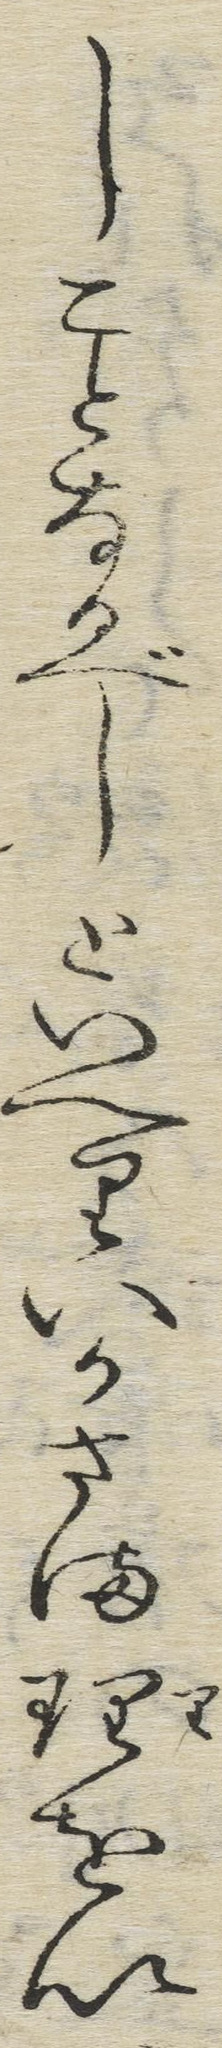しことなるべしといへりいかさま理を以
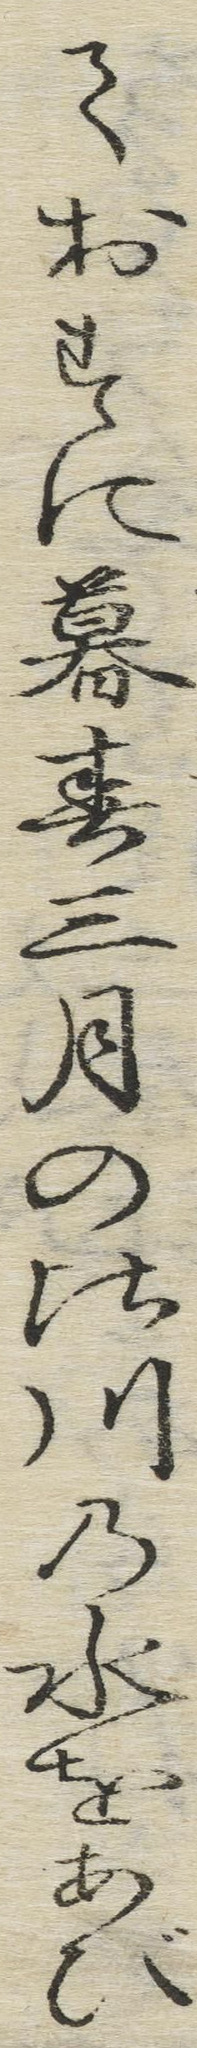ておすに暮春三月の比川の水をあび
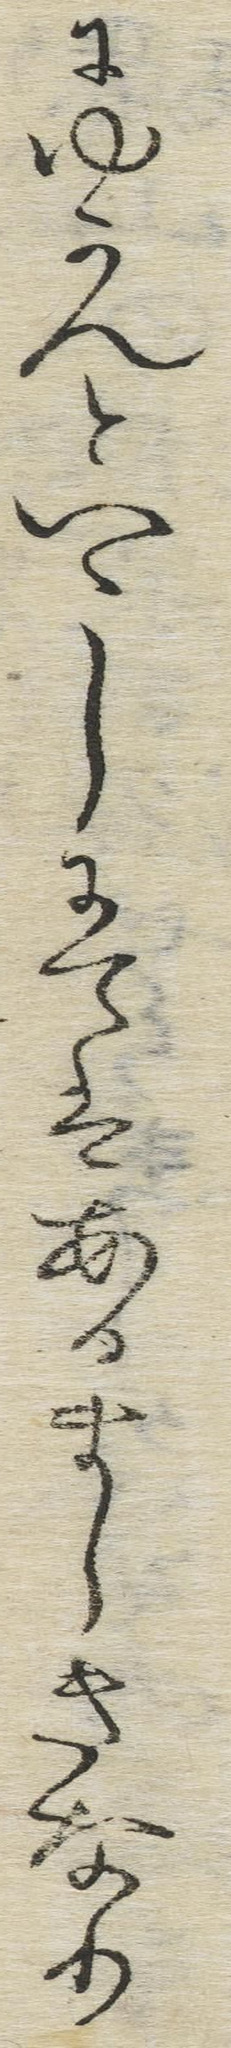にゆかんといゝしにてはあるましきなり
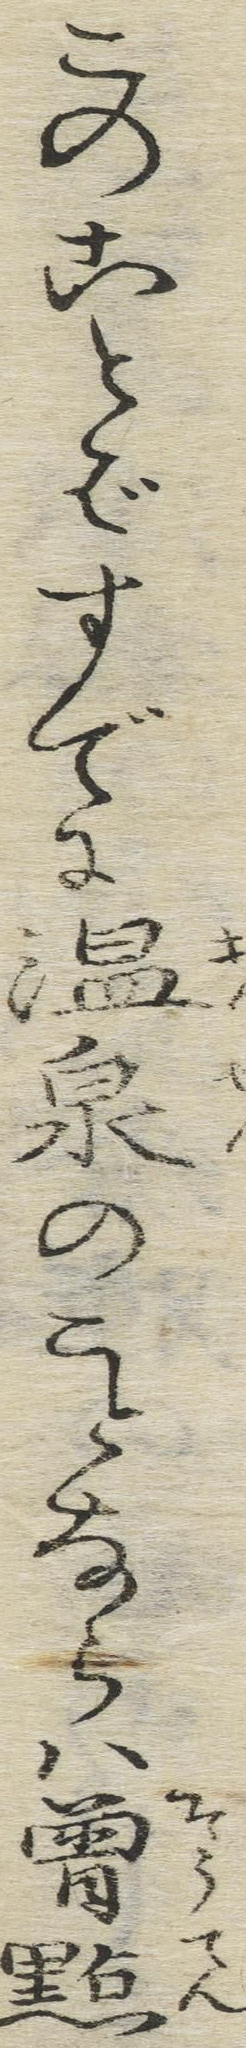このことばすでに温泉のことならは曽点
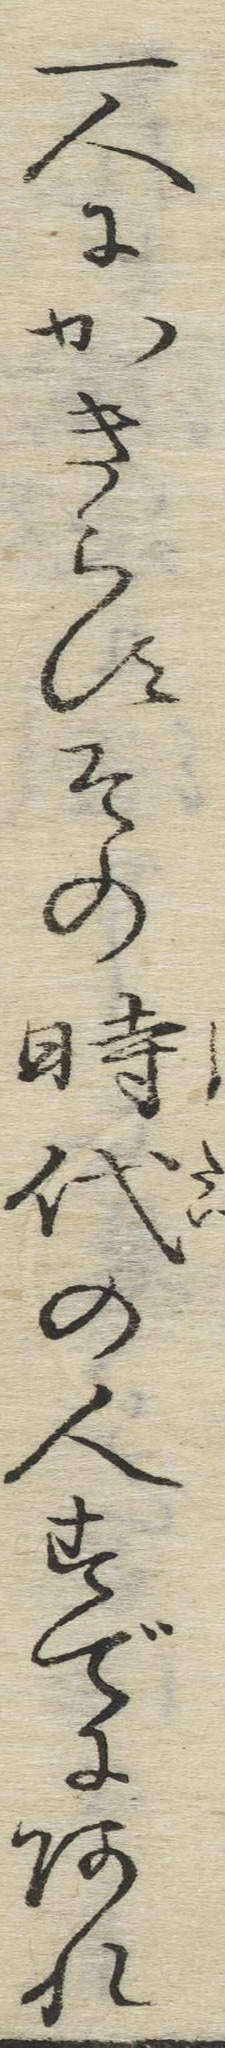一人にかきらすその時代の人すでにあれ

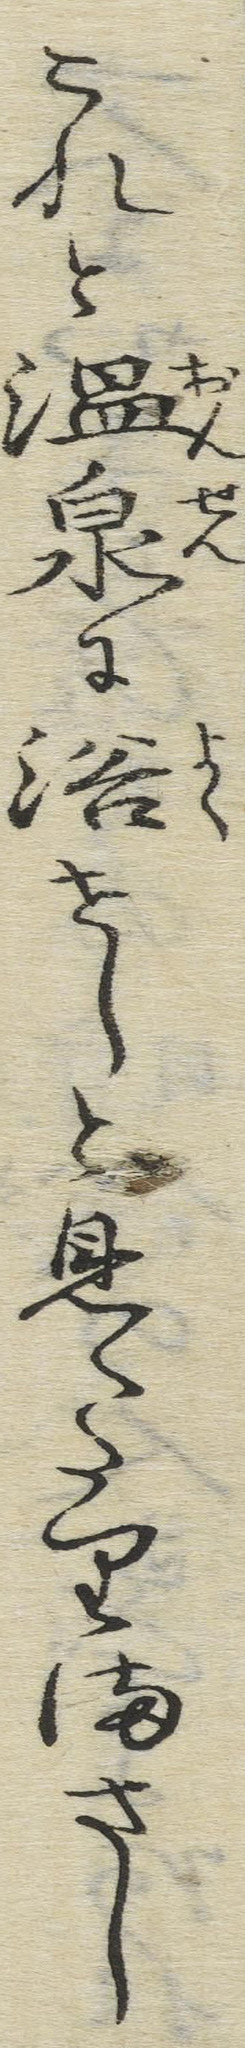これと温泉に浴せしと見へたりまさし
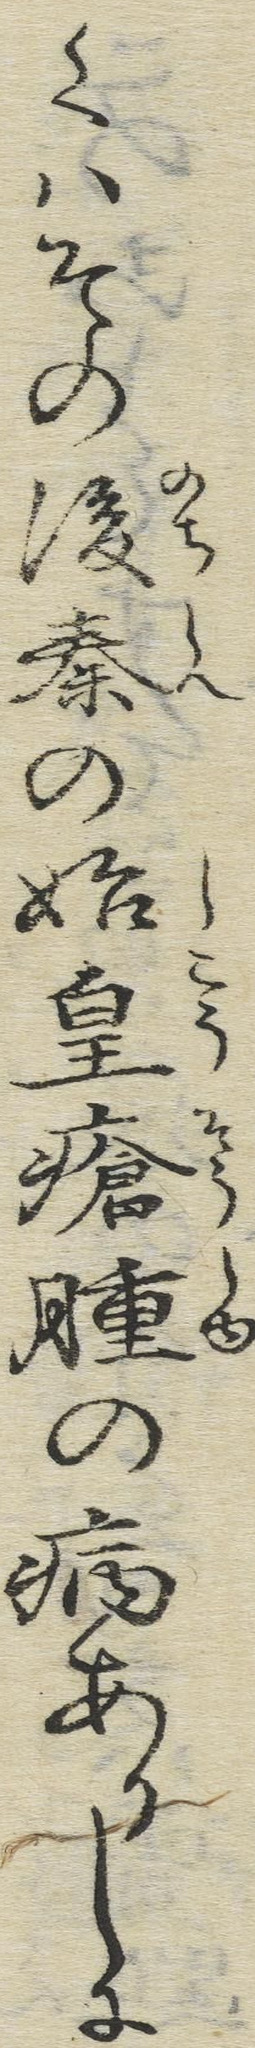くはその後秦の始皇瘡腫の病ありしに
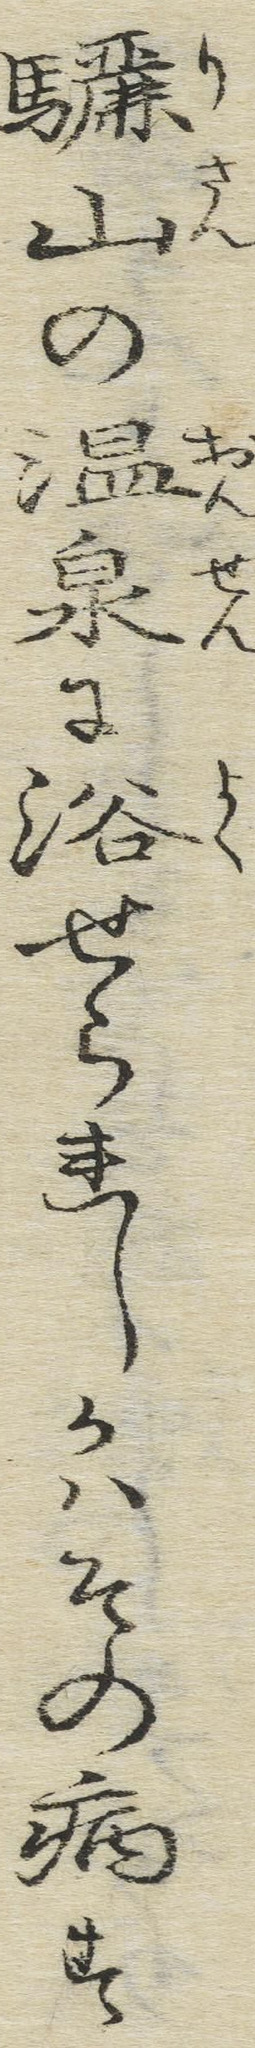驪山の温泉に浴せられしかはその病す
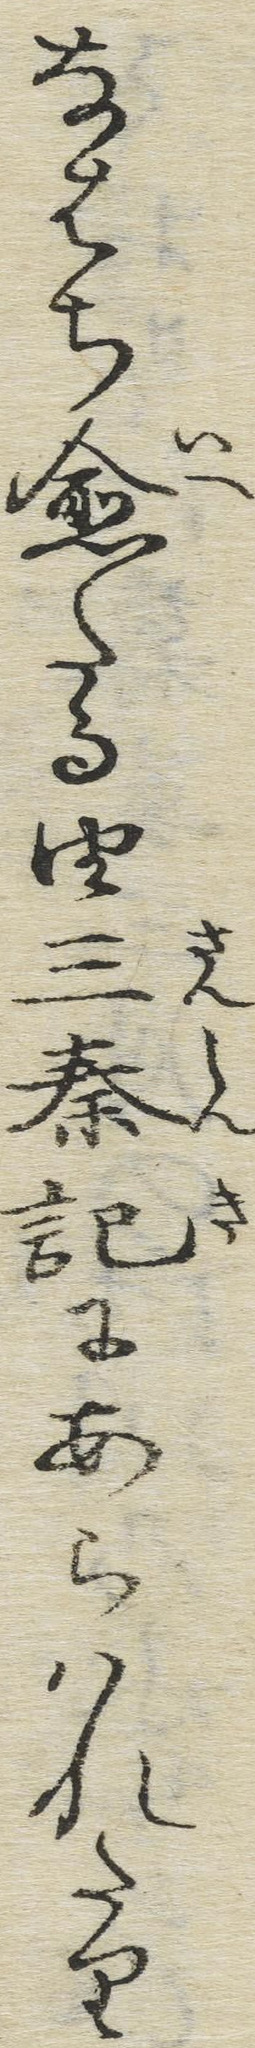なはち愈たる由三秦記にあらはれたり
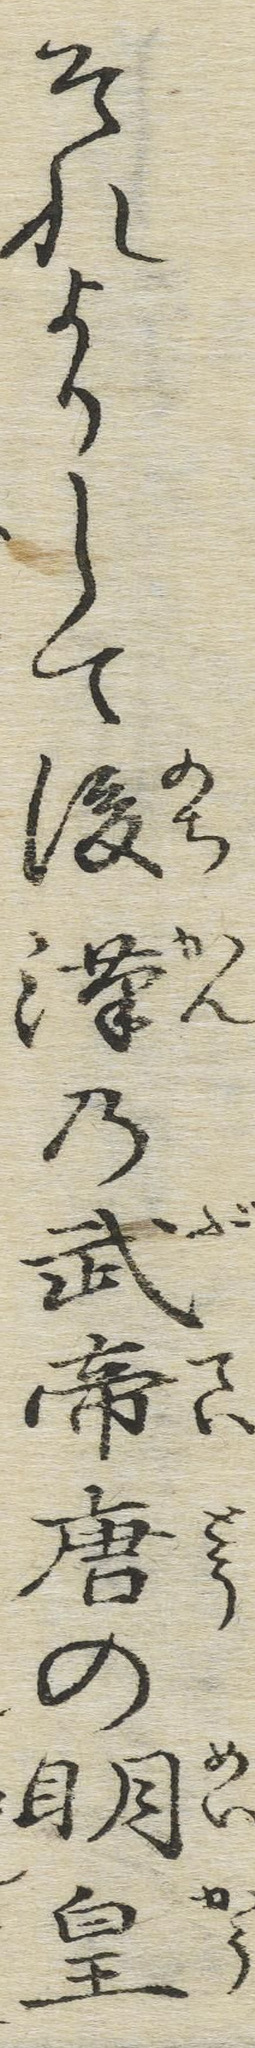それよりして後漢の武帝唐の明皇
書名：温泉考
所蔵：東京大学地震研究所図書室 Earthquake Research Institute Library, The University of Tokyo, JAPAN
